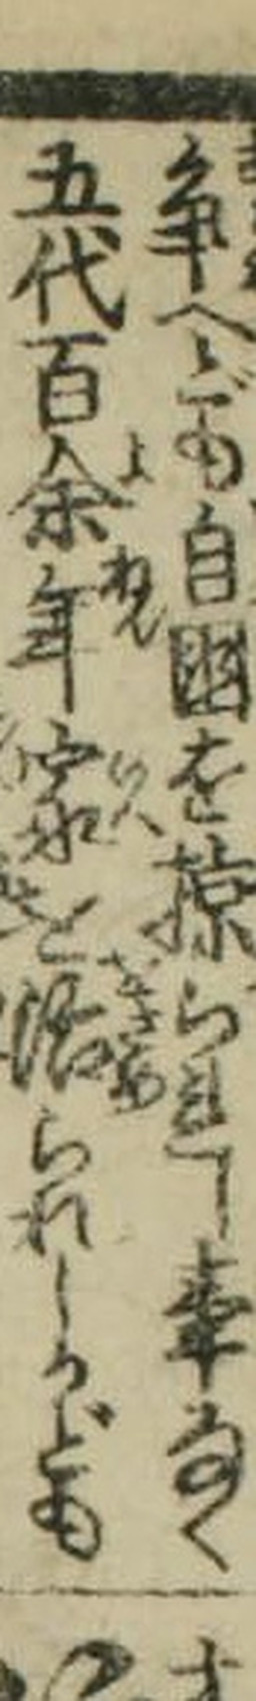五代百余年家を治られしかども
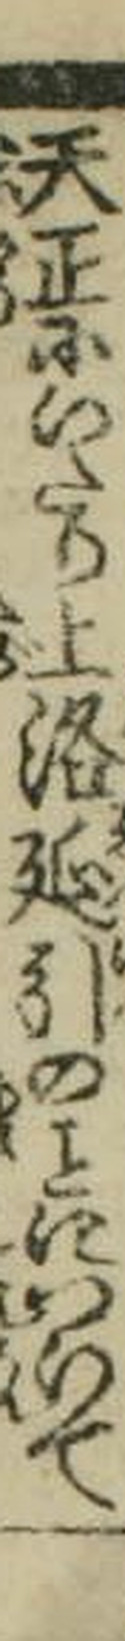天正にいたり上洛延引のことについて
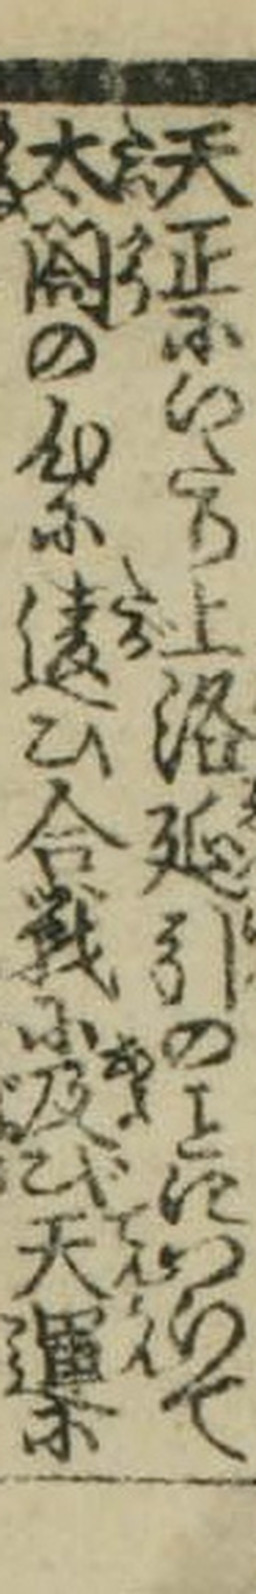太閤の心に違ひ合戦に及び天運に
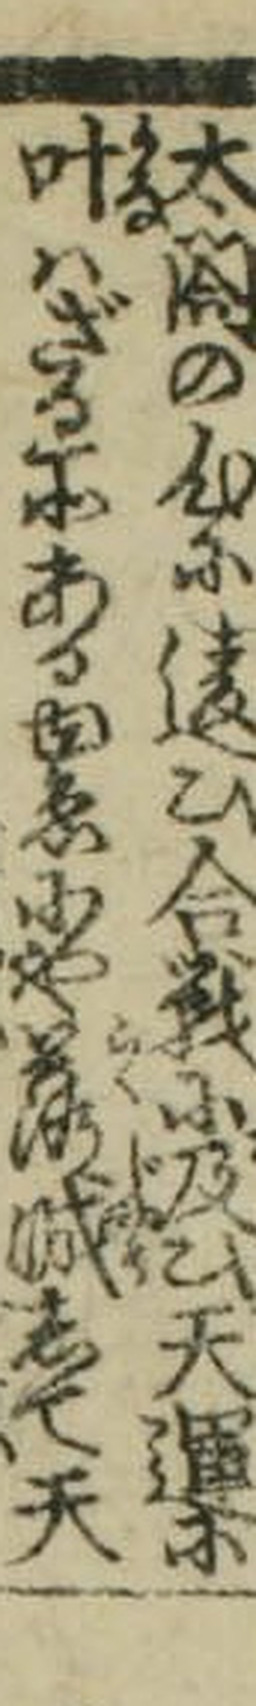叶はざる所あるゆゑにや落城して天
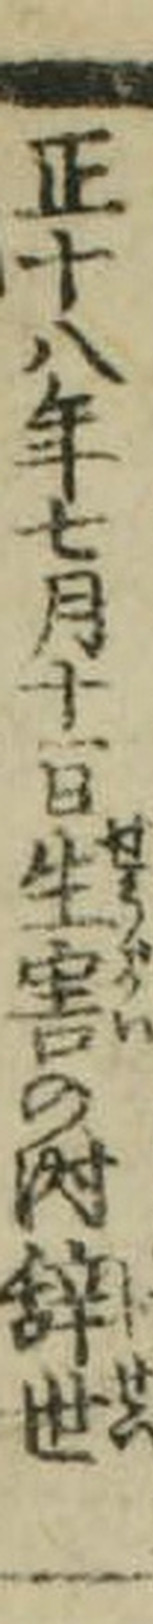正十八年七月十一日生害の時辞世
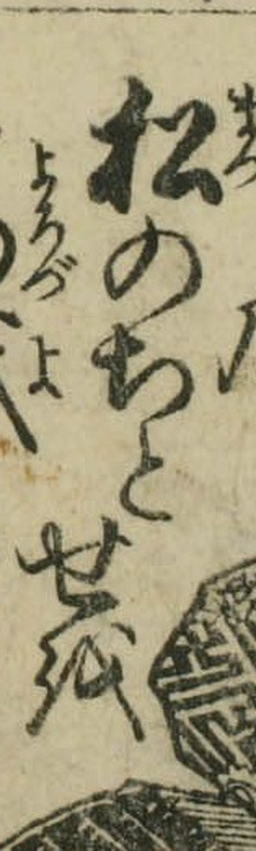松のちとせを
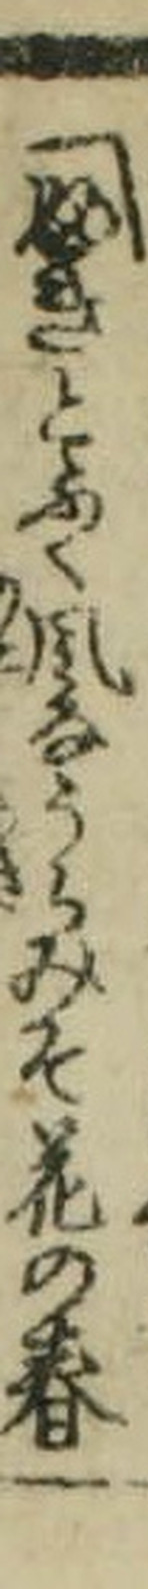〽ふきとふく風なうらみそ花の春
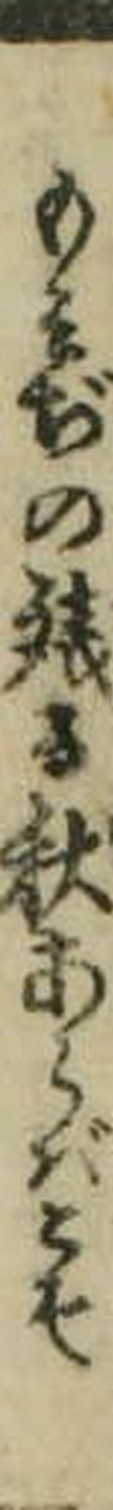もみぢの残る秋あらばこそ
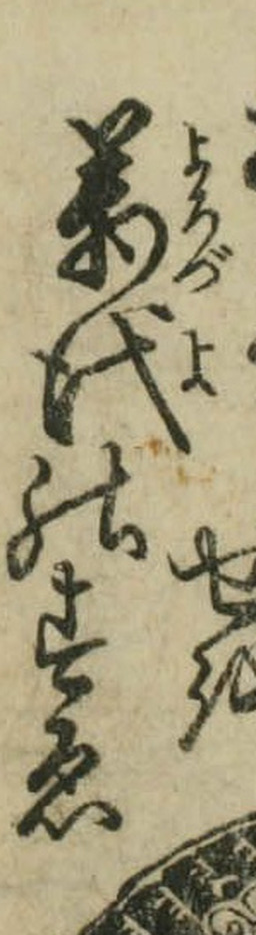万代のすゑ
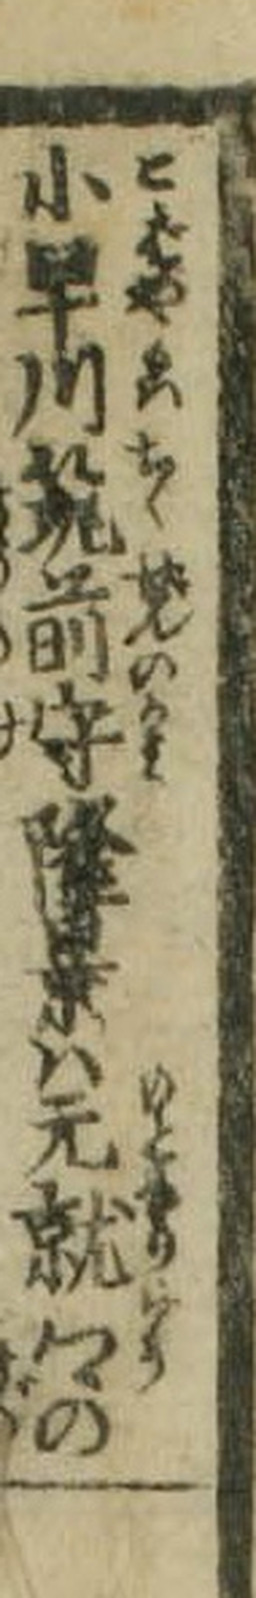小早川筑前守隆景は元就卿の
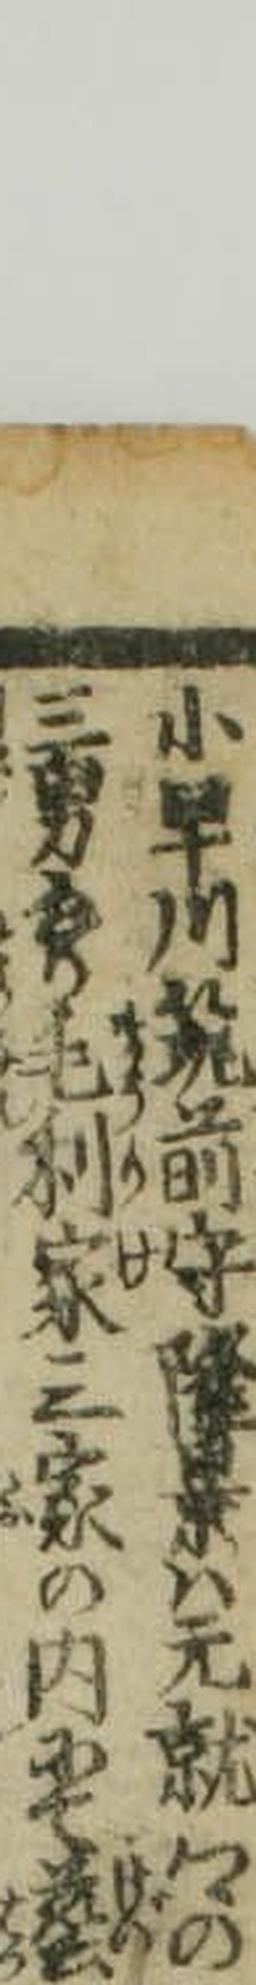三男なり毛利家三家の内にて芸
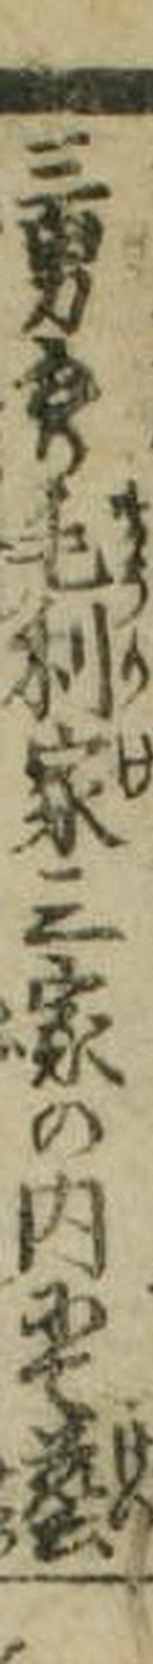三男なり毛利家三家の内にて芸
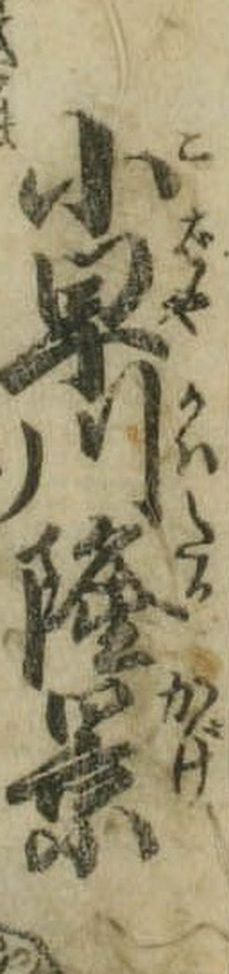小早川隆景
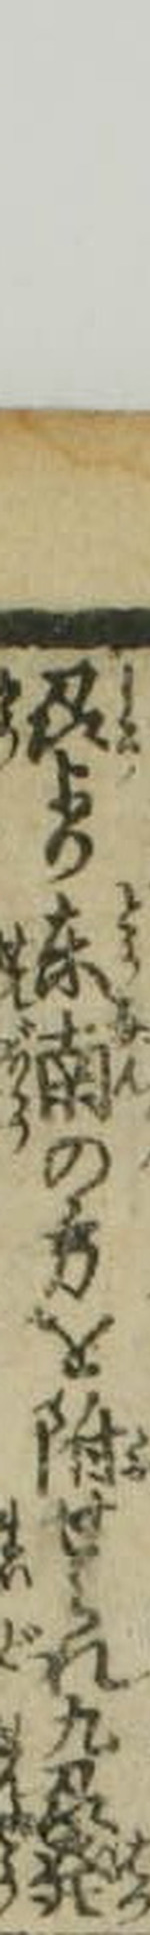州より東南の方を附せられ九州発
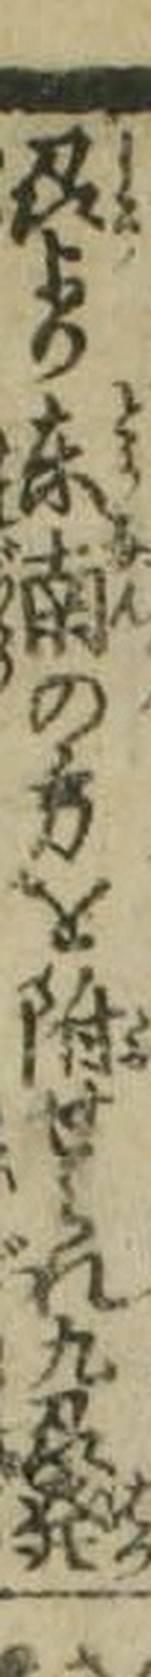州より東南の方を附せられ九州発
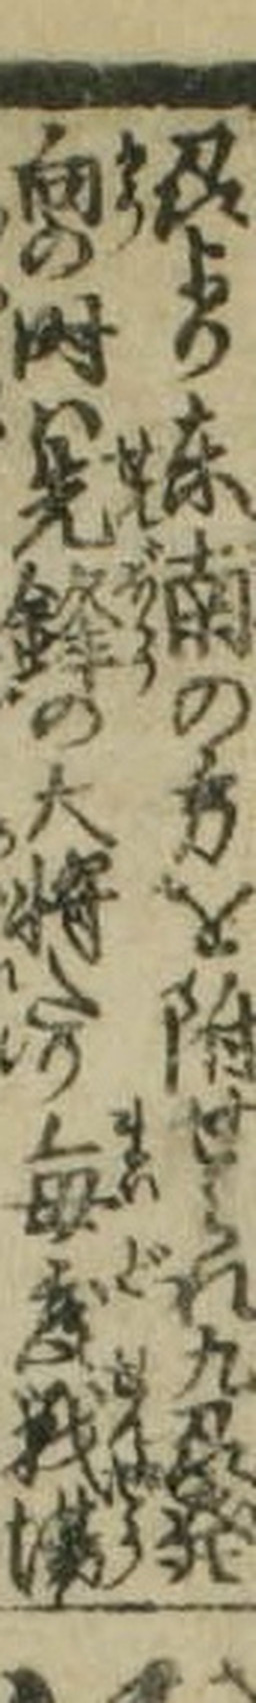向の時は先鋒の大将たり毎度戦場
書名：續英雄百人一首
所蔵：東京学芸大学附属図書館
